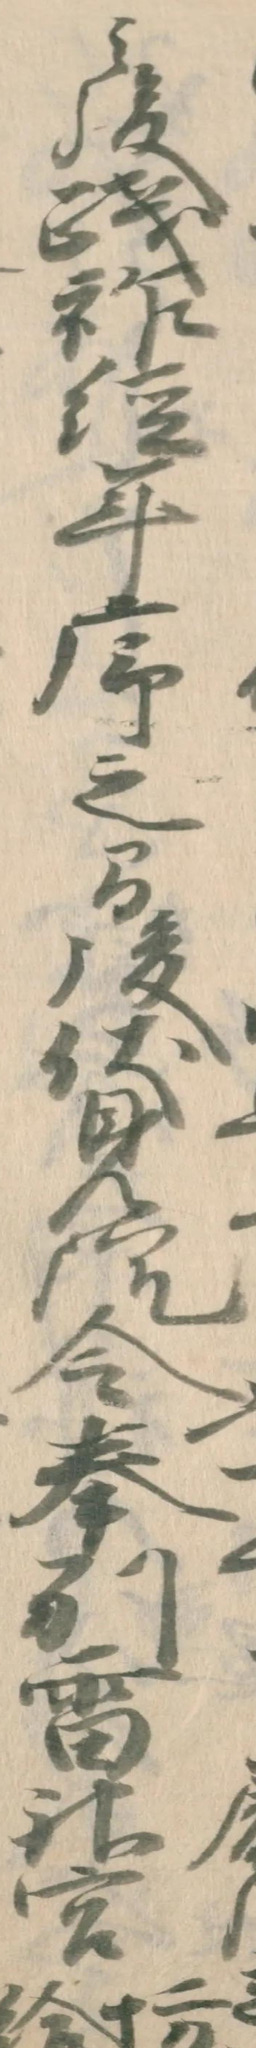之後践祚経年序之間後伏見院令奉別雷神宮給
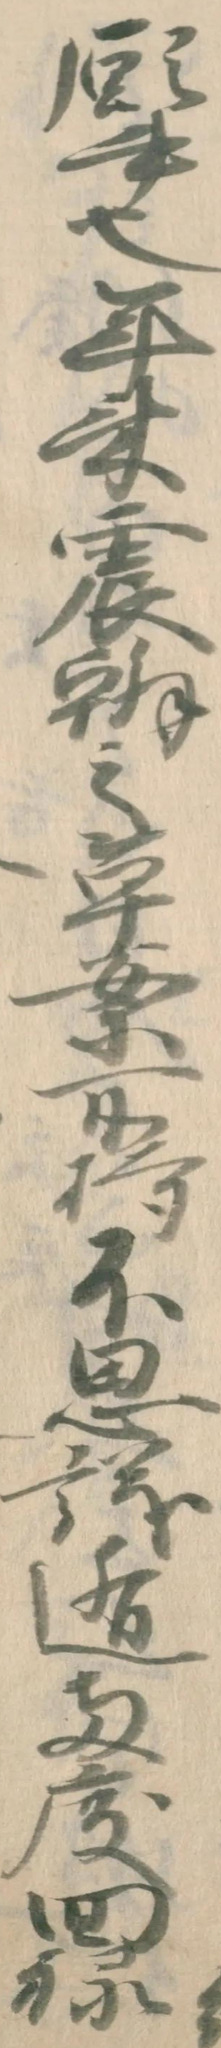願書也年来宸翰之草案所持不思議遁両度回禄

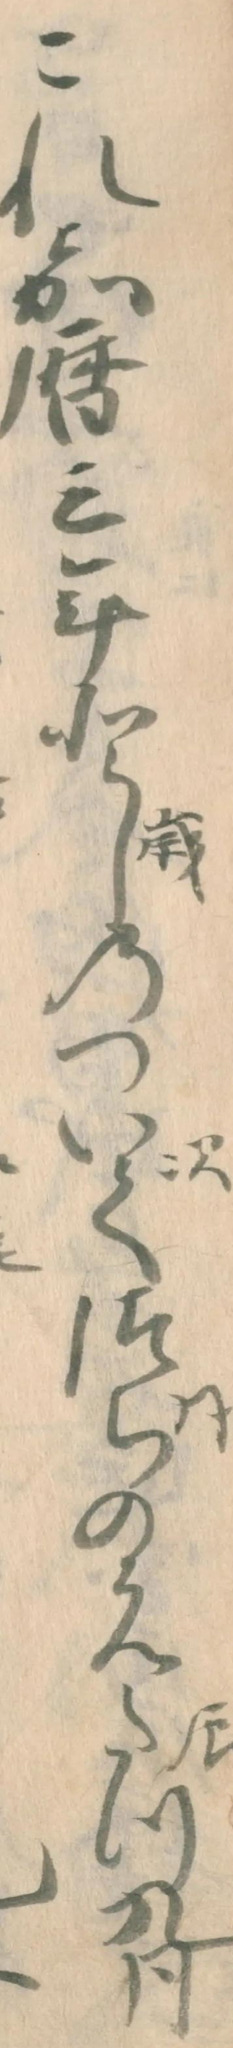これ嘉暦三年としのついてつちのえたつ九月
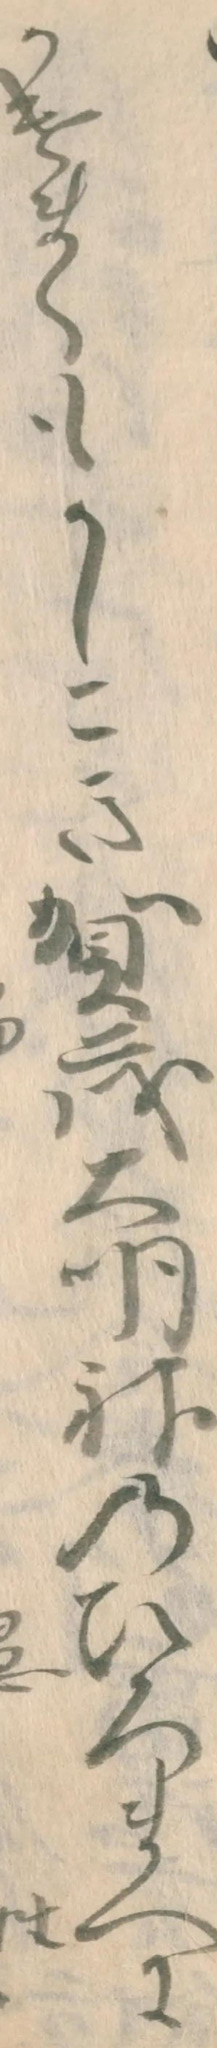かけまくもかしこき賀茂大明神のひろまへに
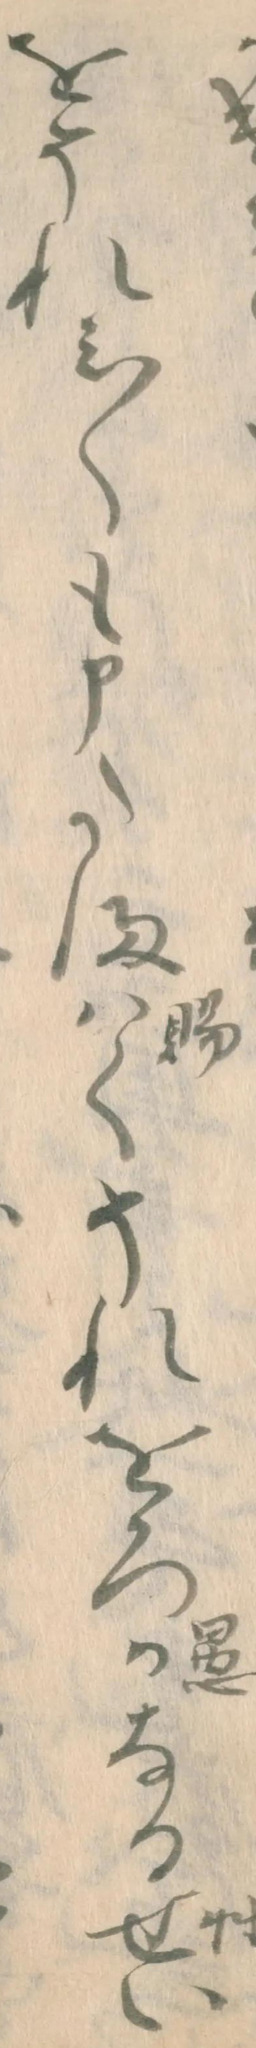をそれみ〳〵も申たまはくそれをろかなるせい
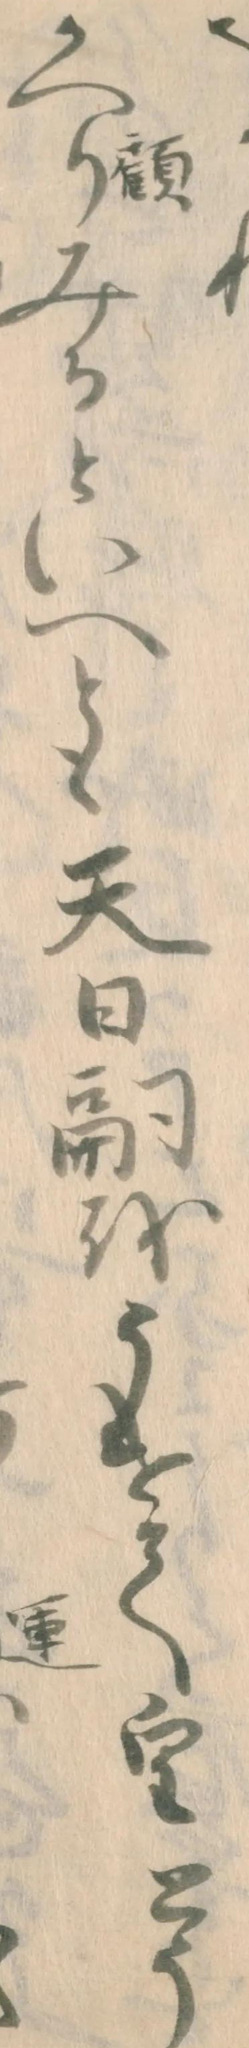かへりみるといへとも天日嗣をうけて皇とう
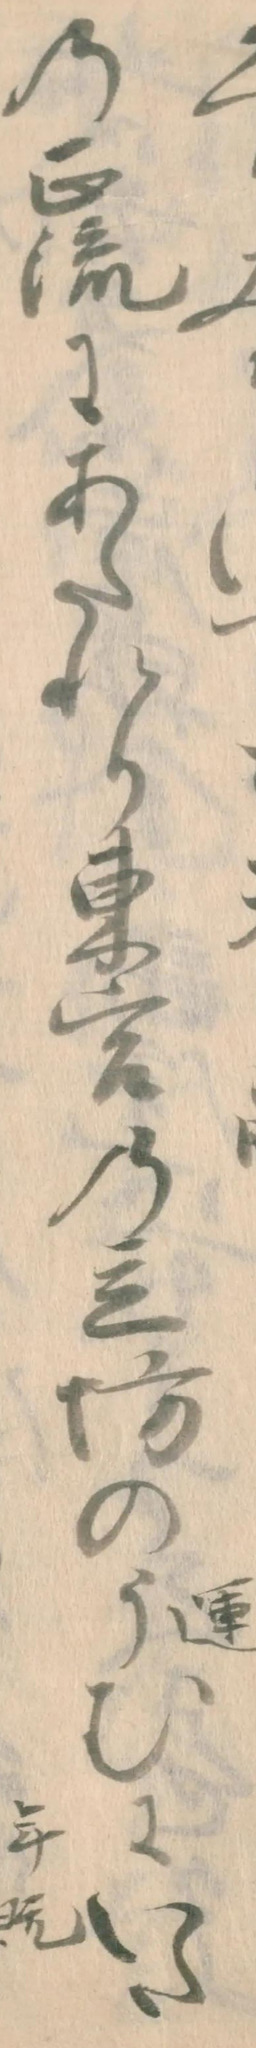の正流にあたれり東宮の立坊のうむにいた
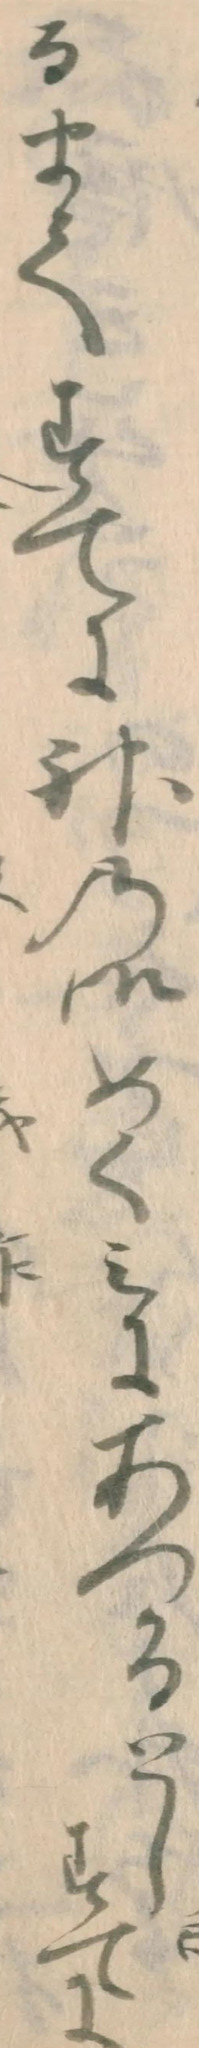るまてすてに神の御めくみにあつかるとしすてに
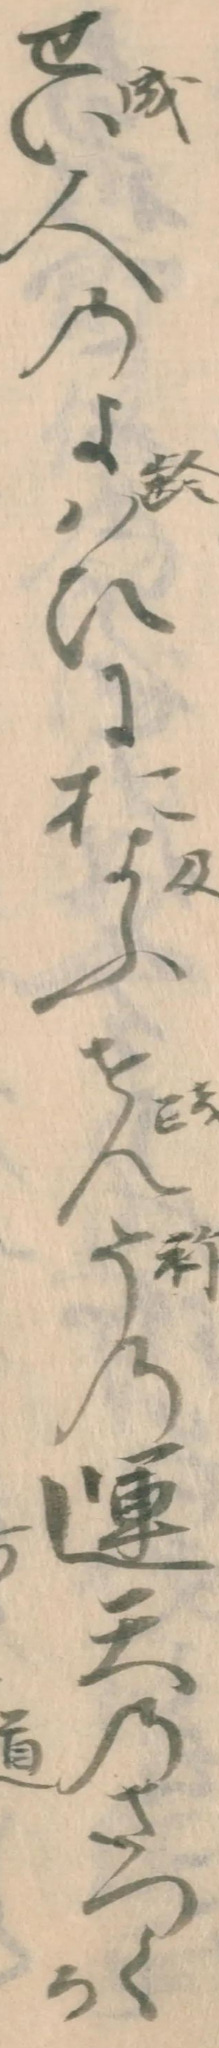せい人のよはひにおよふせんその運天のさつくる
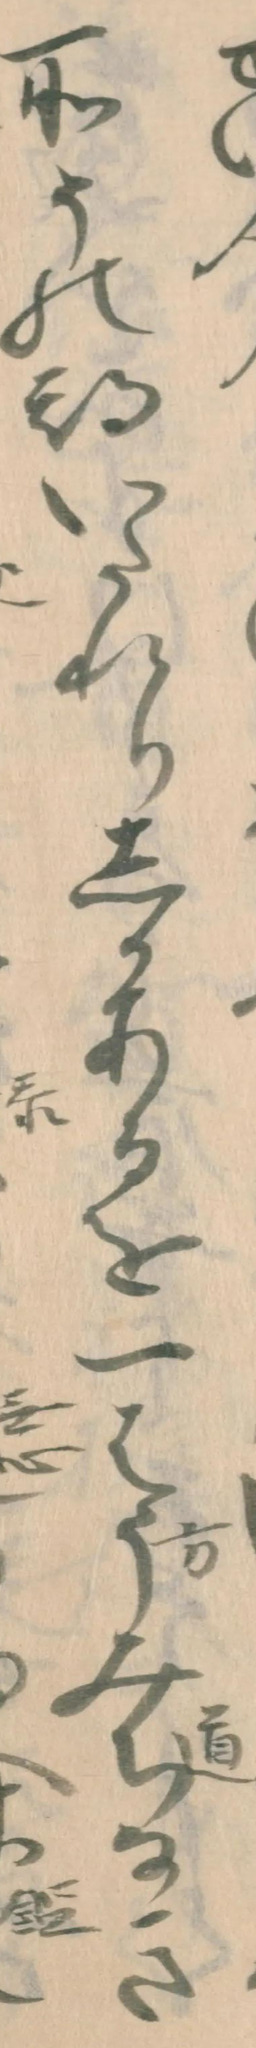所その期いたれりしかあるを一はうみちなき
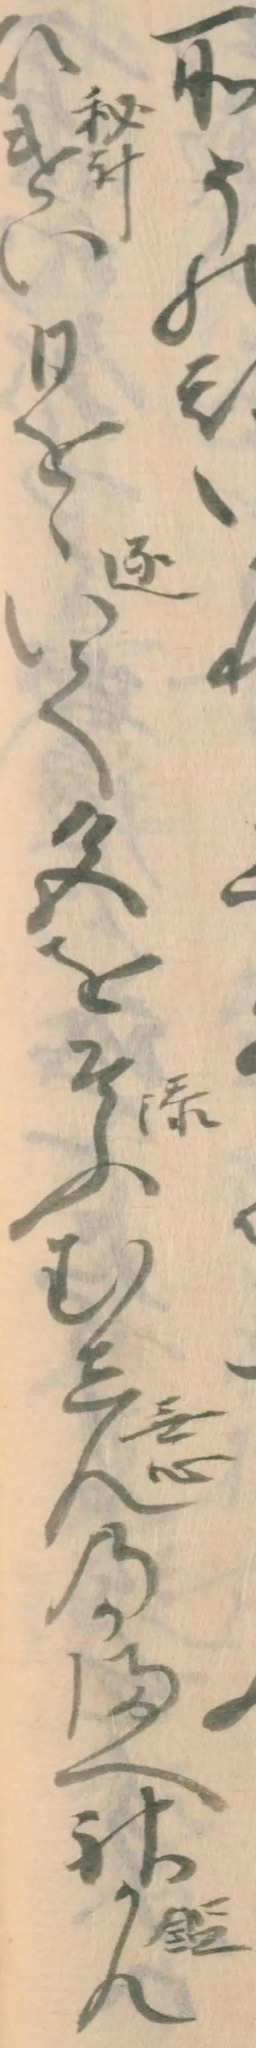ひけい日をゝいて色をそふむしんのかまへ神かん
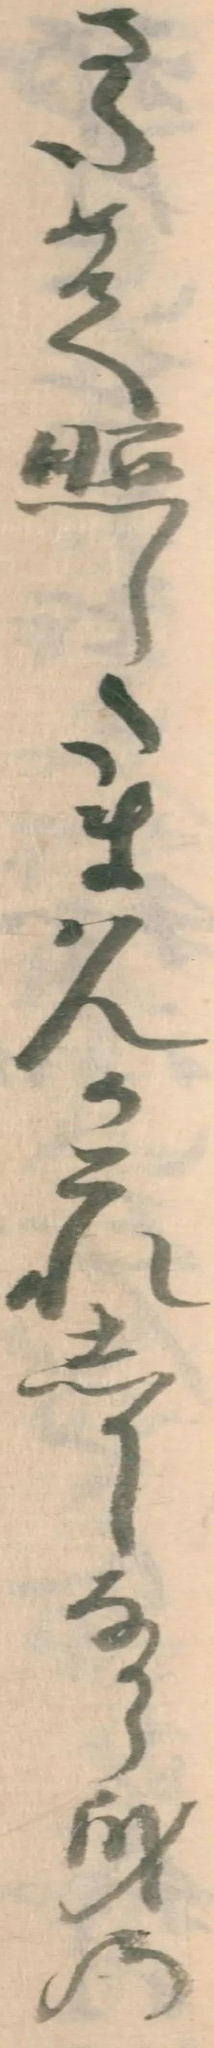さためて照したまはんかこれしかしなから身の
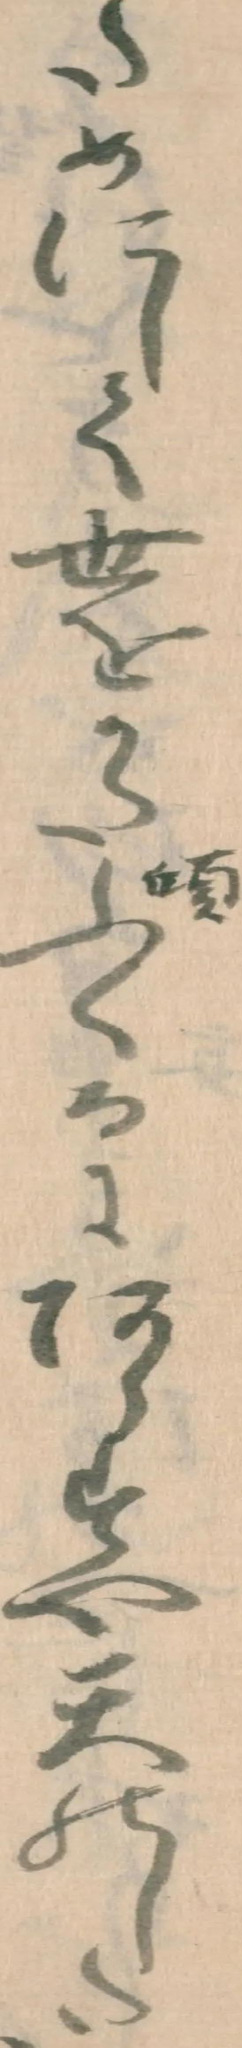ためにして世をかたふくるにあらすや天のしたは
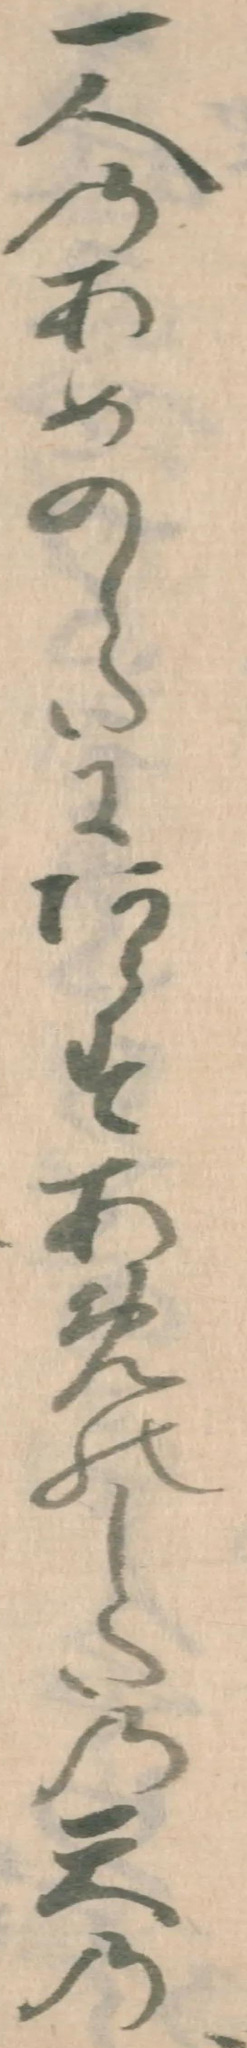一人のあめのしたにあらすあめのしたの天の
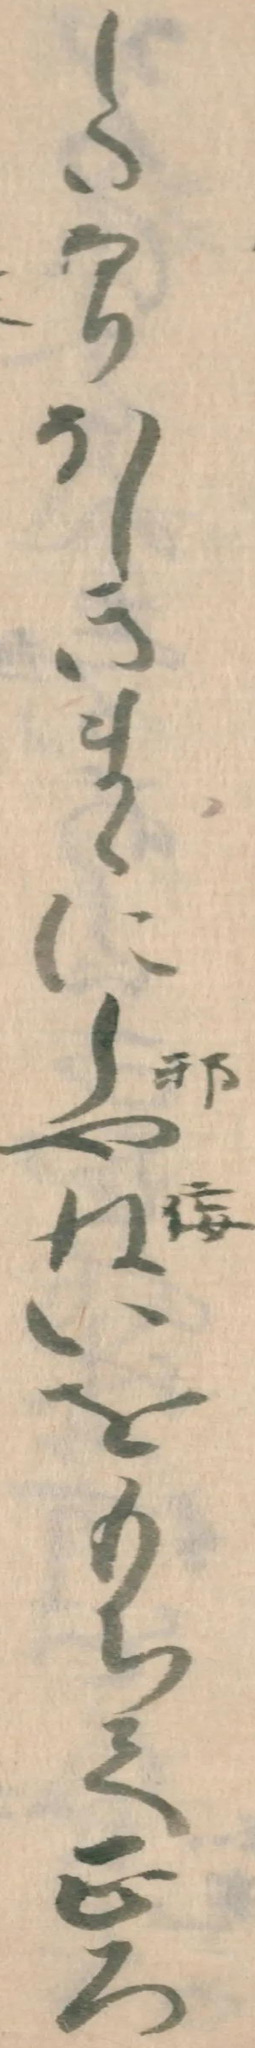したなりほしきまゝにしやねいをもちて正ろ
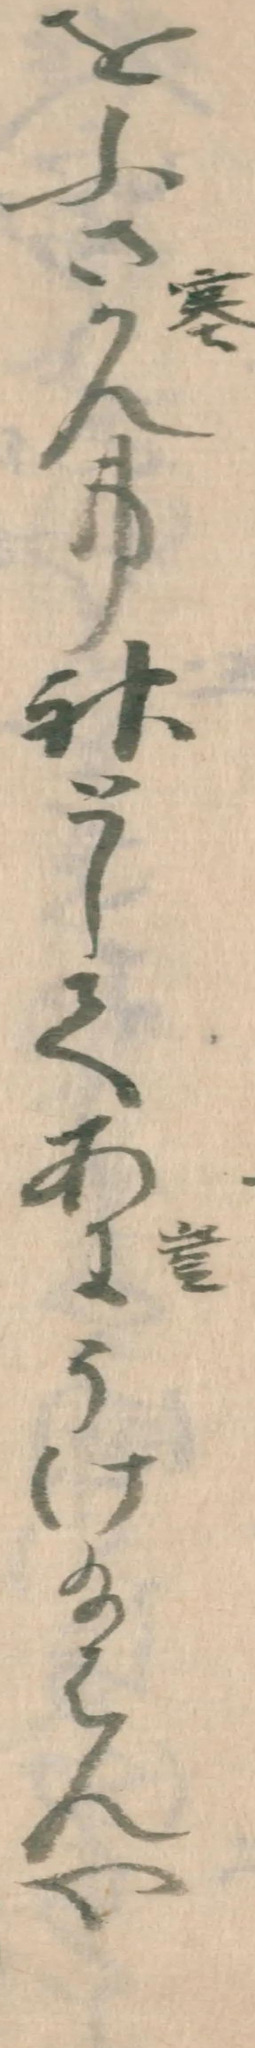をふさかん事神としてあにうけ給はんやそも
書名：賀茂社記録. 第1冊
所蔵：国立国会図書館 National Diet Library, JAPAN
